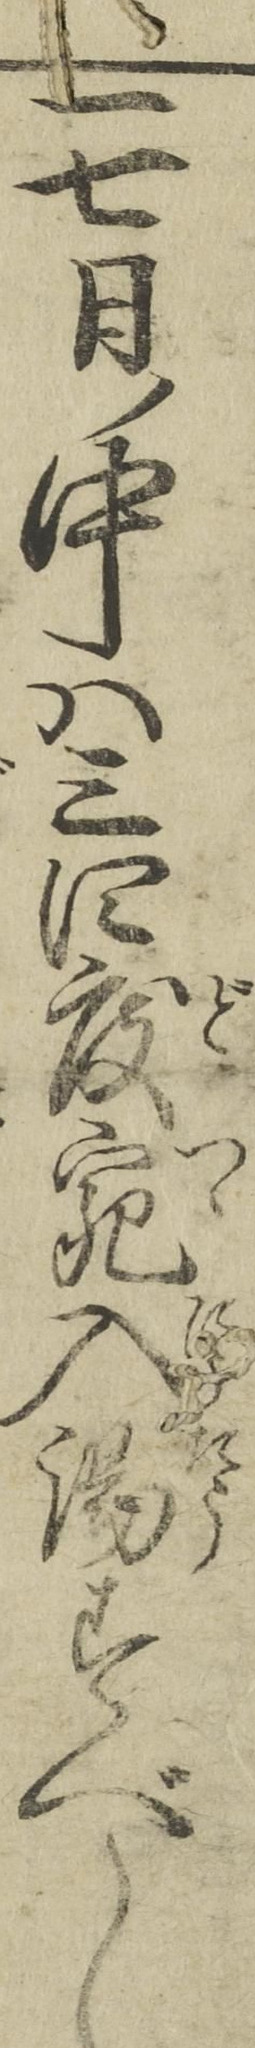一七日の中は三四度宛入湯すべし
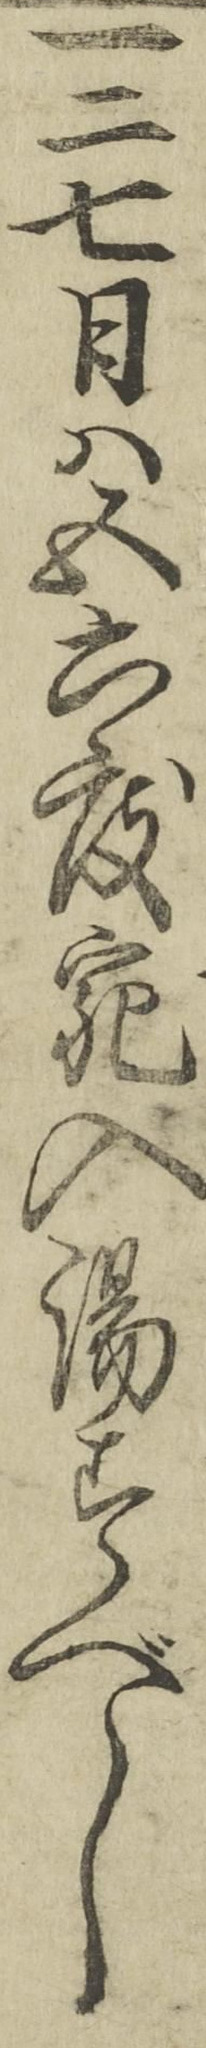一二七日は五六度宛入湯すべし
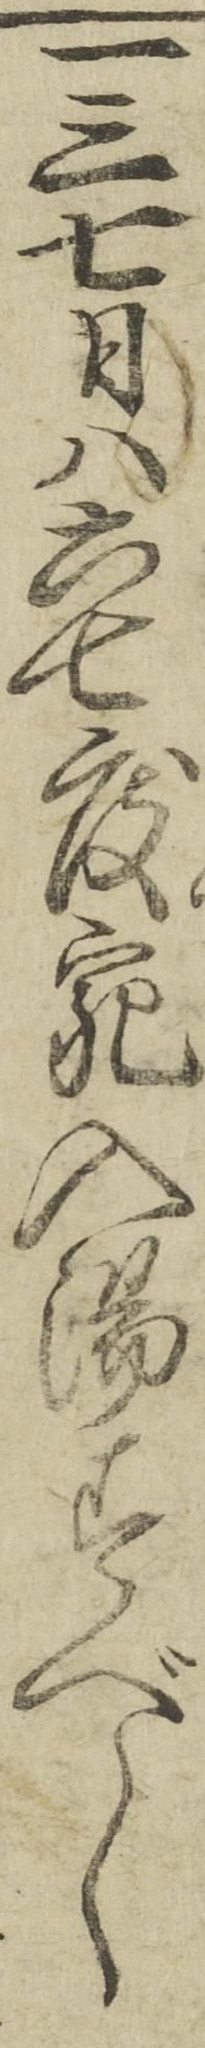一三七日は六七度宛入湯すべし
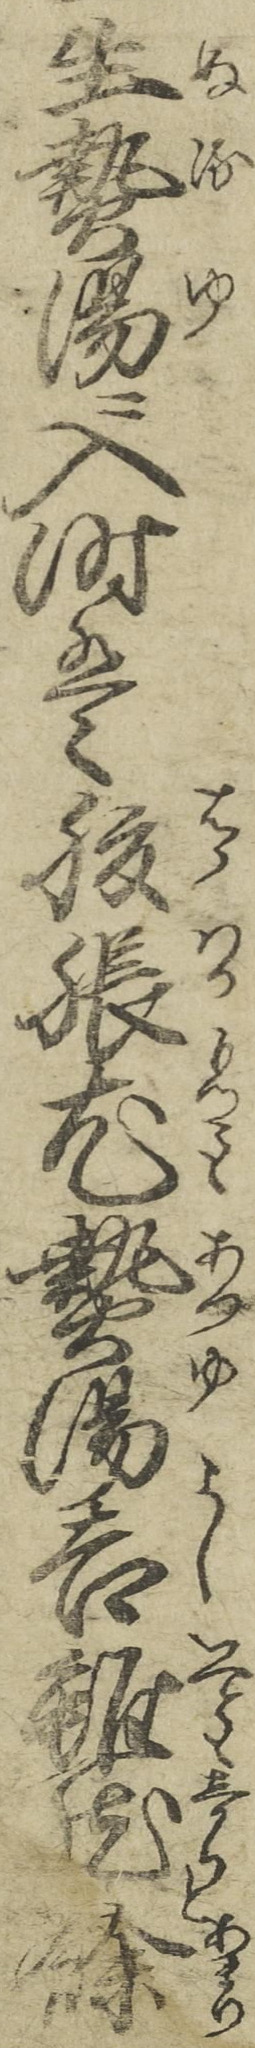一生熱湯に時は腹張尤熱湯吉雖然余
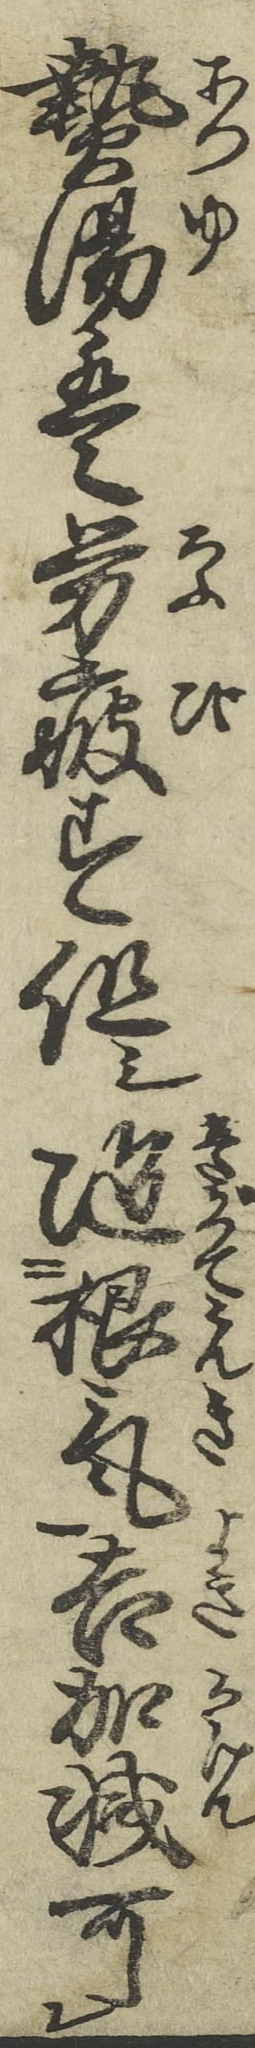熱湯は労疲す但し随根気吉加減可
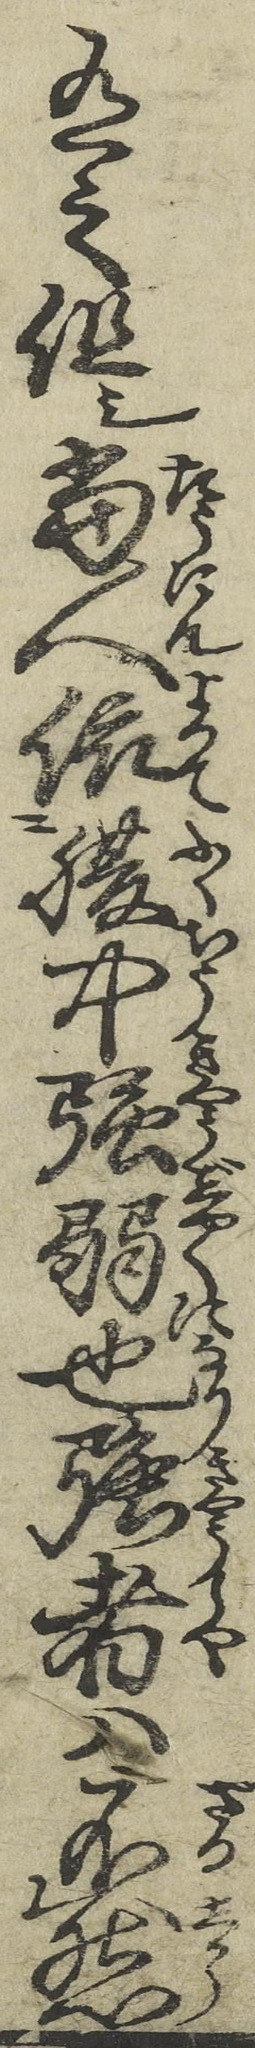有之但し当人依腹中強弱也強者は不然
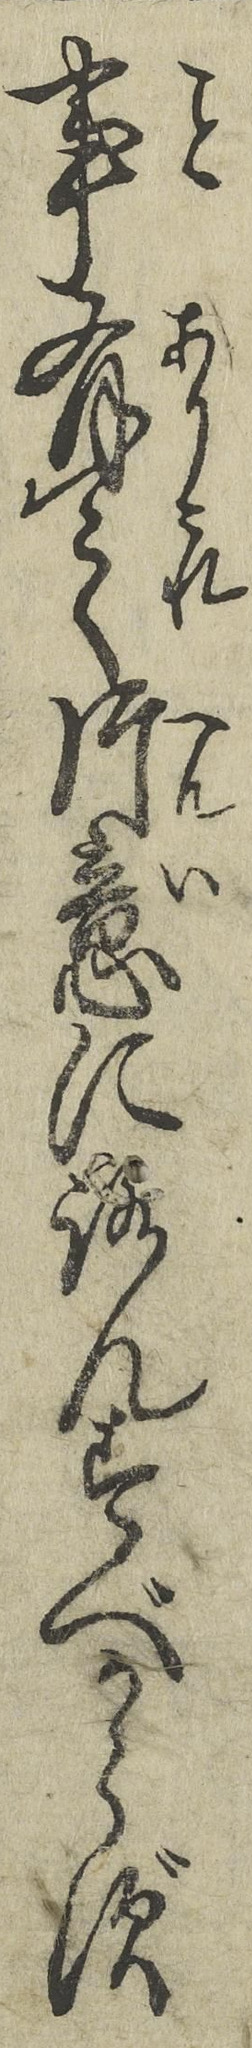事有之片意にろんすべからず
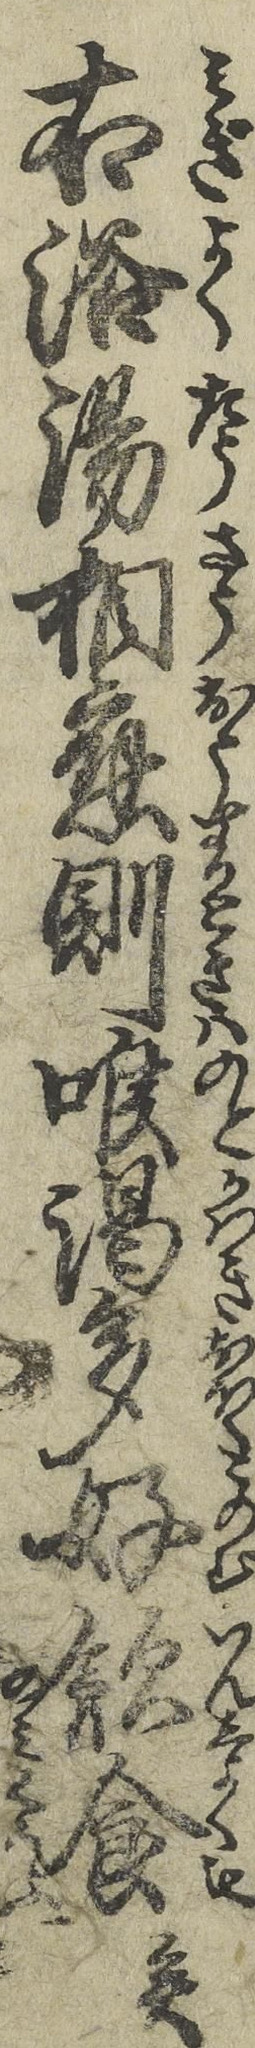右浴湯相応則喉渇多好飲食矣

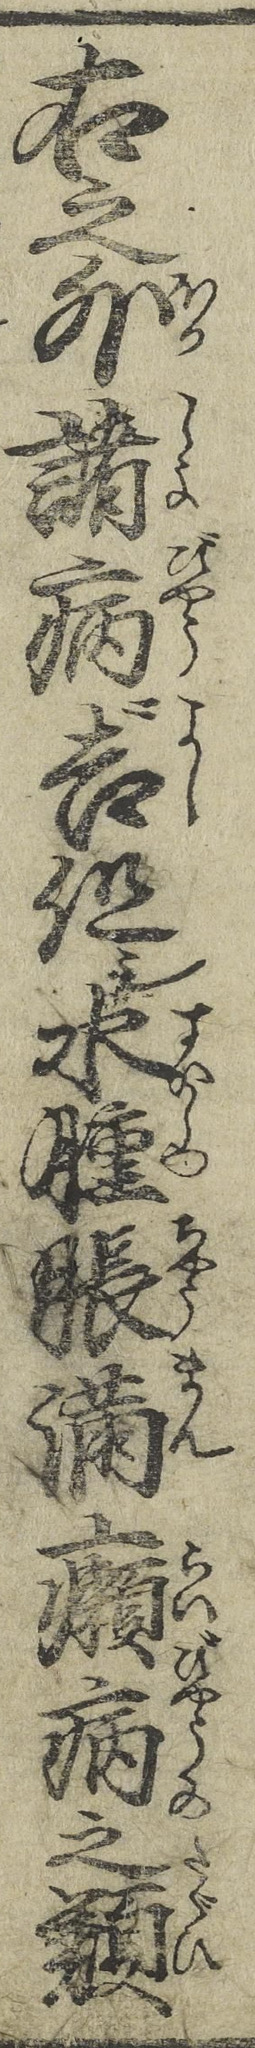右之外諸病に吉但し水腫腸満癩病之類
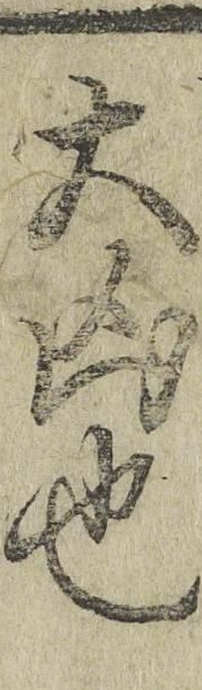大凶也

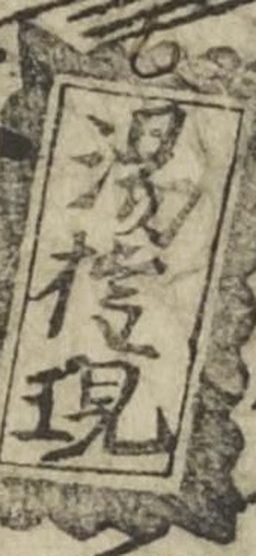湯権現

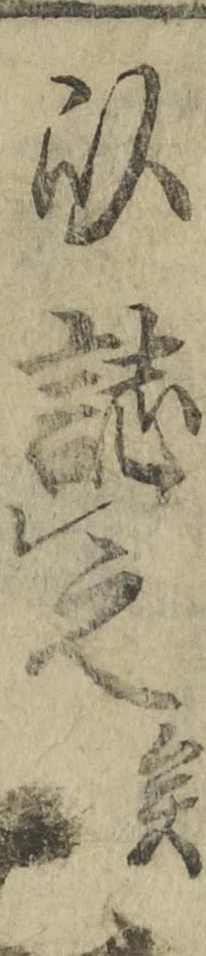以誌之矣
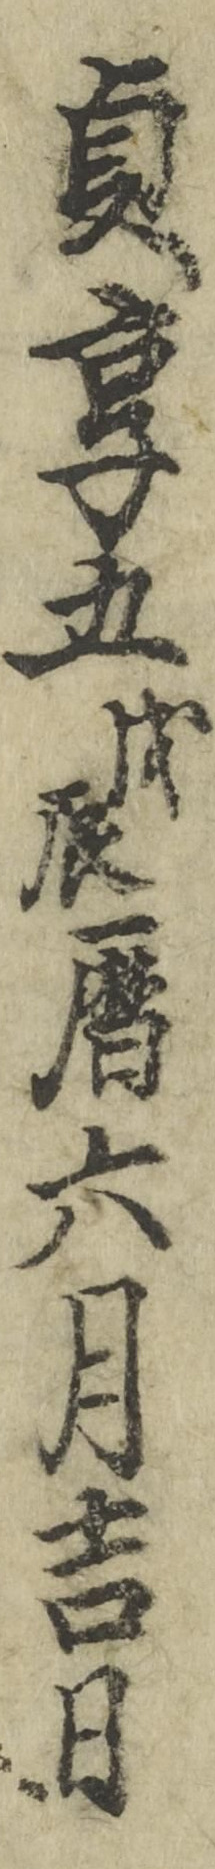貞享五戊辰暦六月吉日
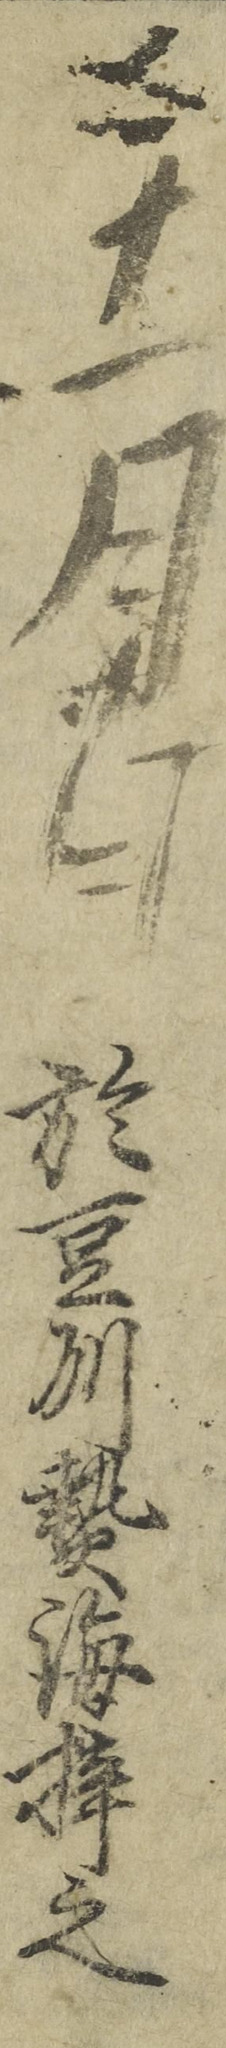於豆州熱海梓之
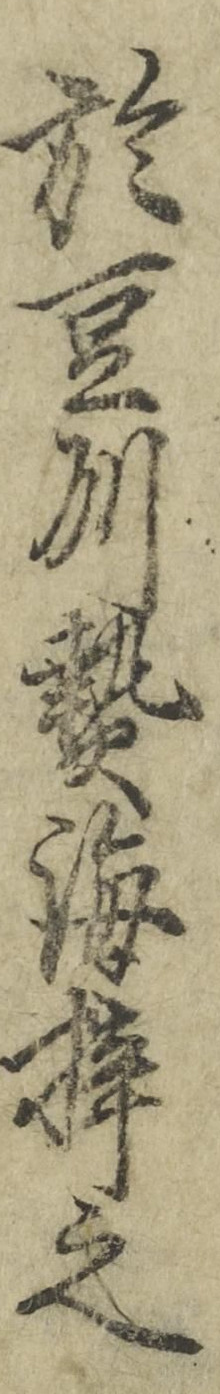於豆州熱海梓之
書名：伊豆國熱海温泉縁起
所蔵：東京大学地震研究所図書室 Earthquake Research Institute Library, The University of Tokyo, JAPAN
